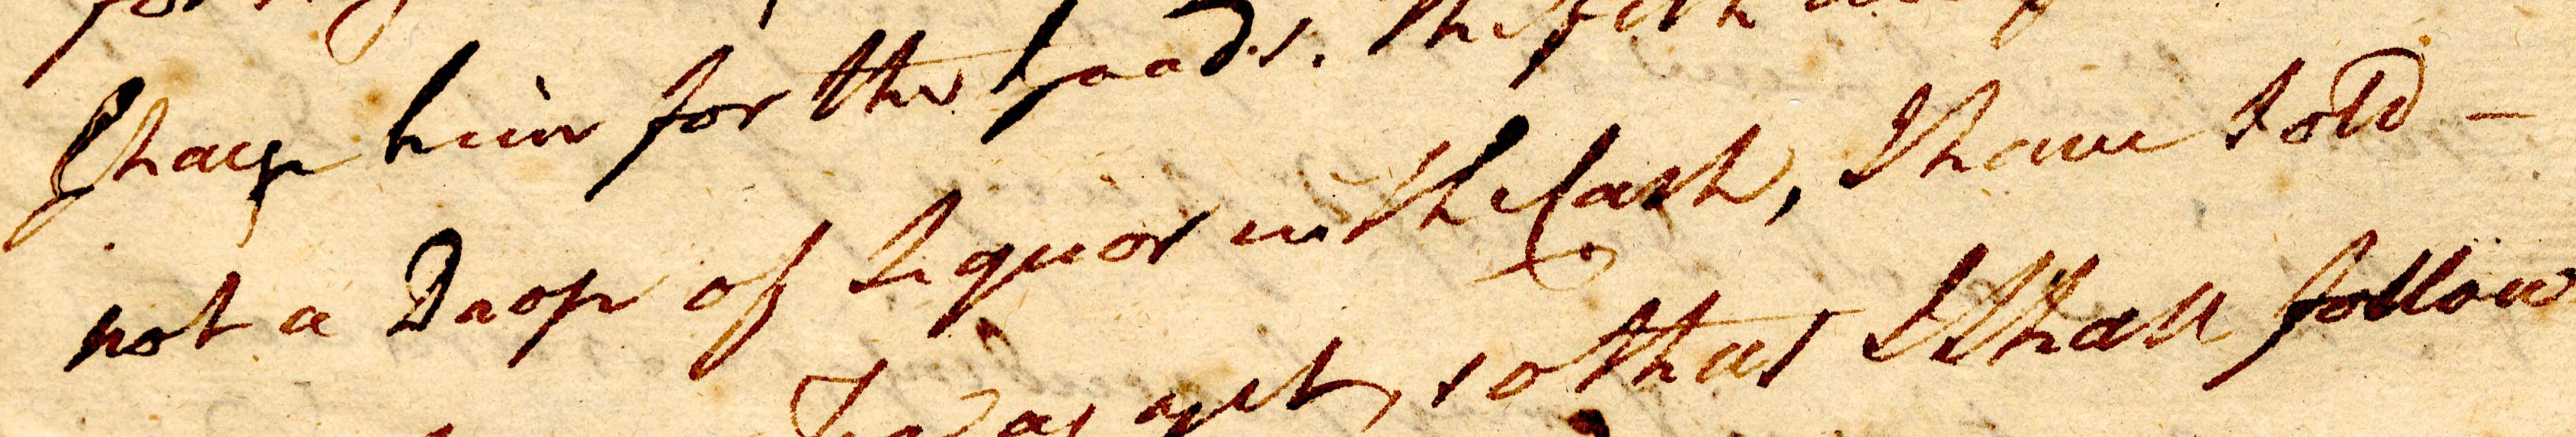not a Drop of Liquor with cash, I have sold-
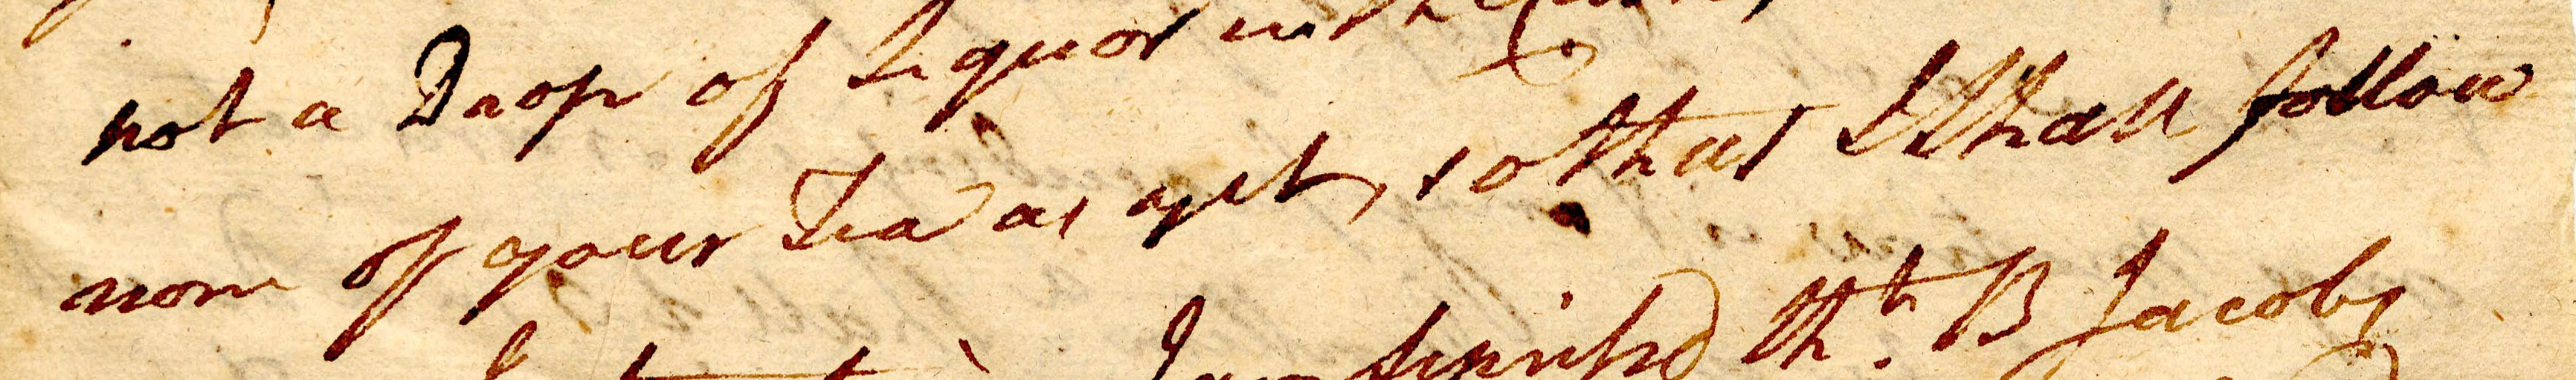none of your Tea as yet, so that I shall follow
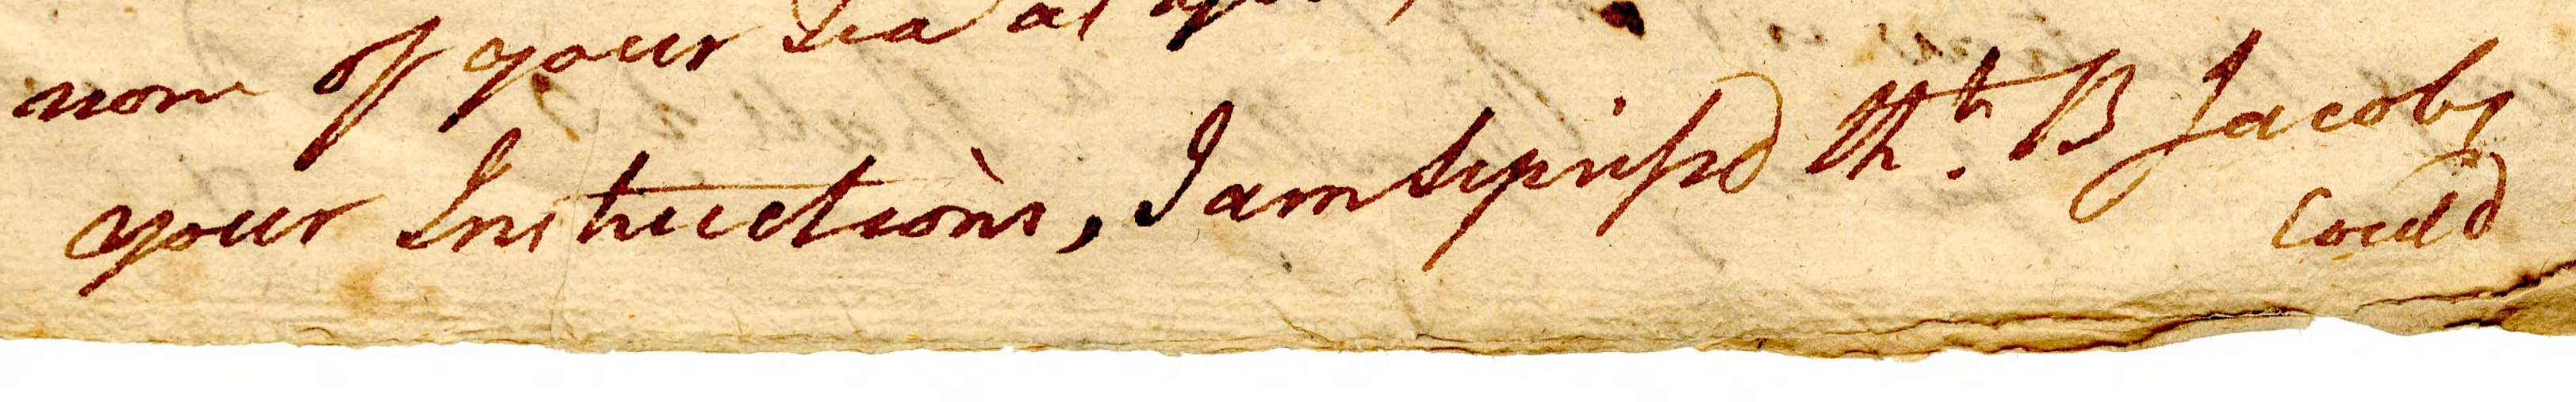your Instructions I am supris'd th^t. B Jacobs
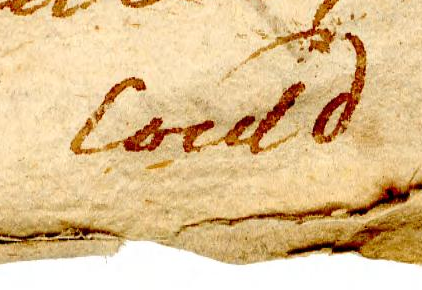could
